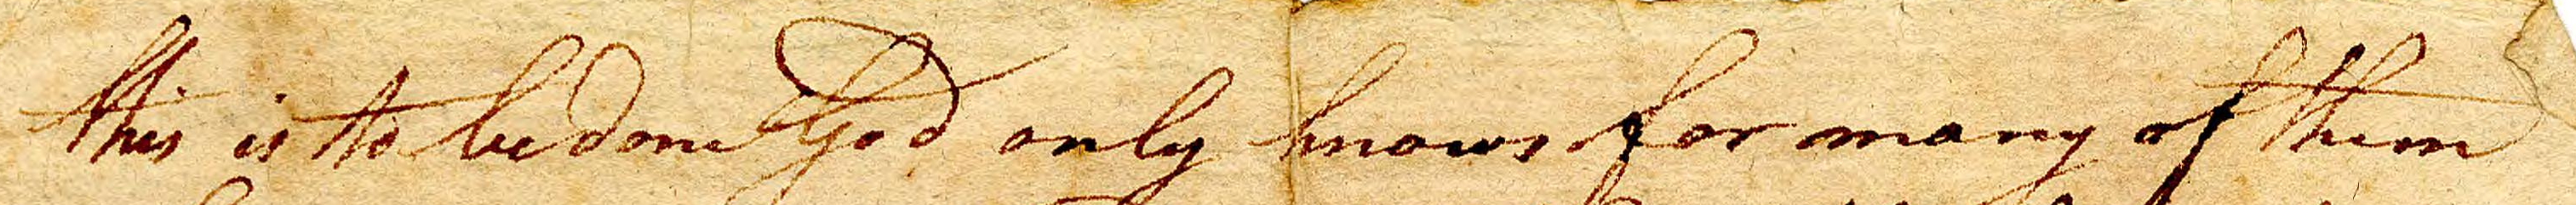this is to be done God only knows for many of them
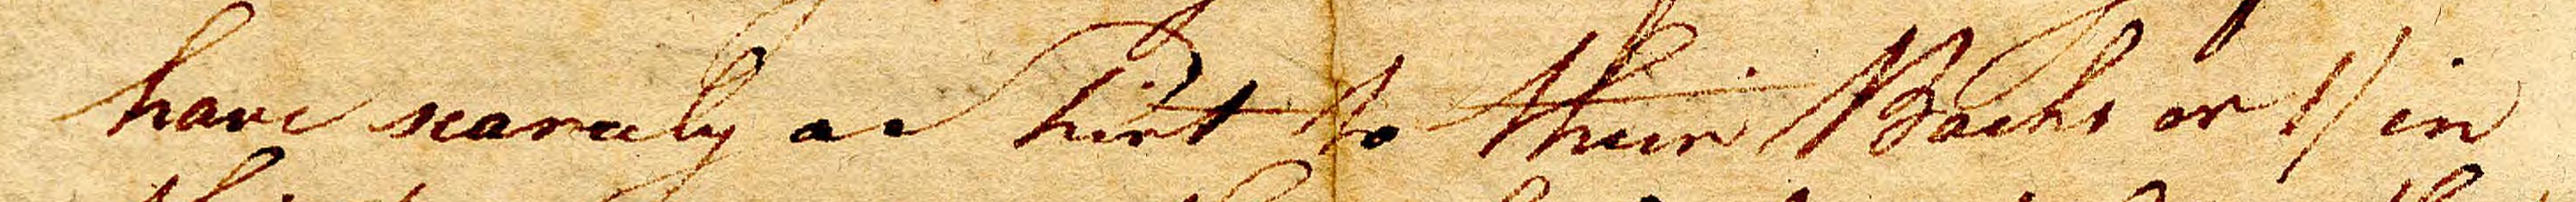have scarcely a Shirt to their Backs or 1s in
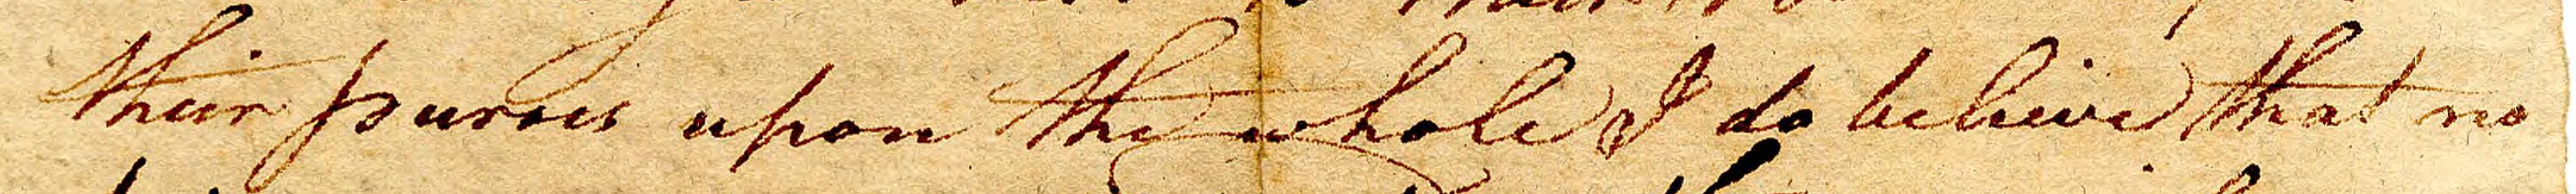their purses upon the whole I do believe that no
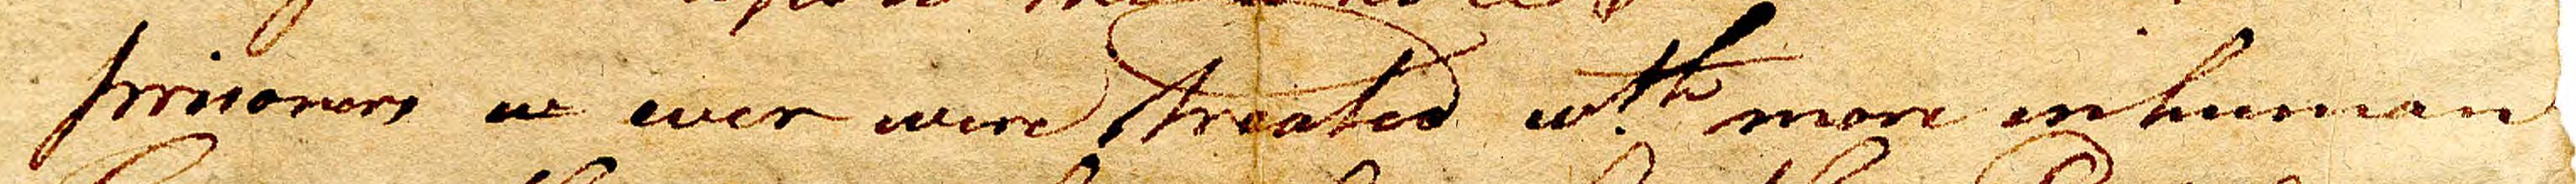prisoners as ever were treated w^th. more inhuman
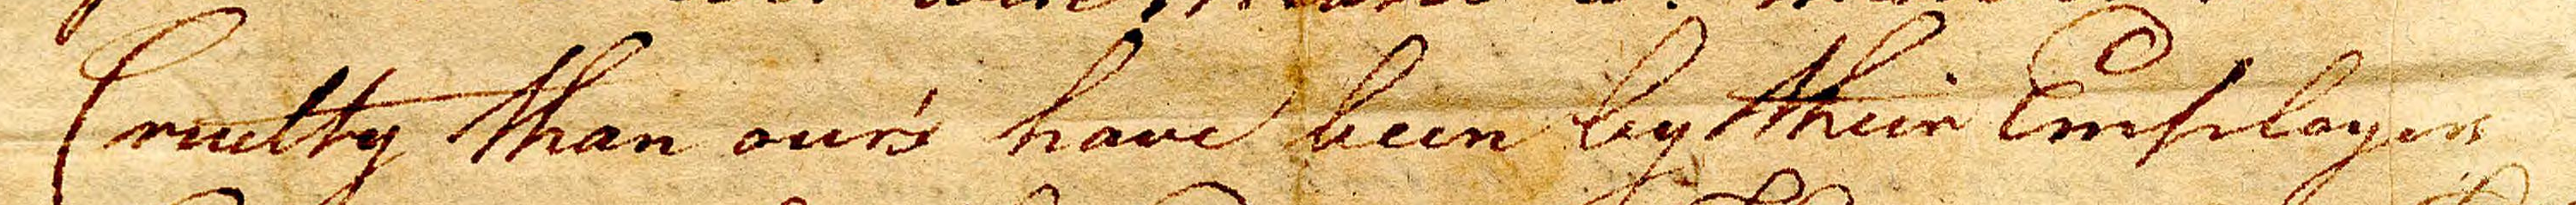Cruelty than ours have been by their Employers
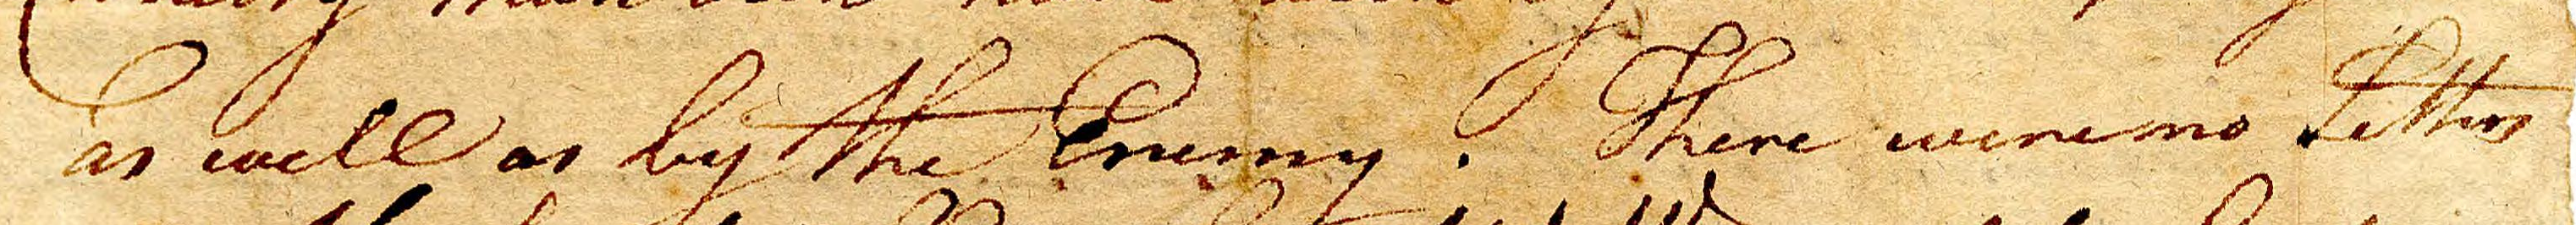as well as by the Enemy. There were no Letters
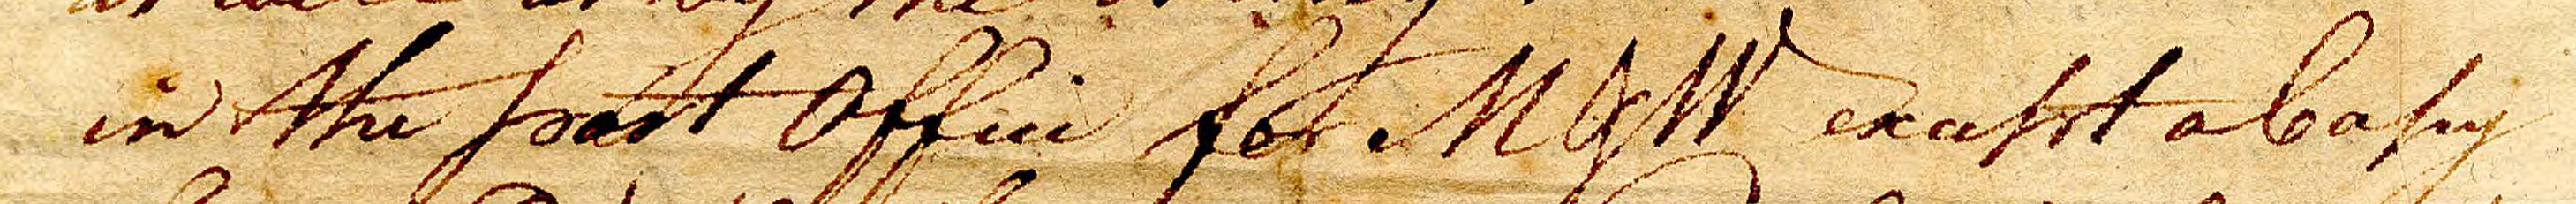in the post Office for M & W except a Copy
